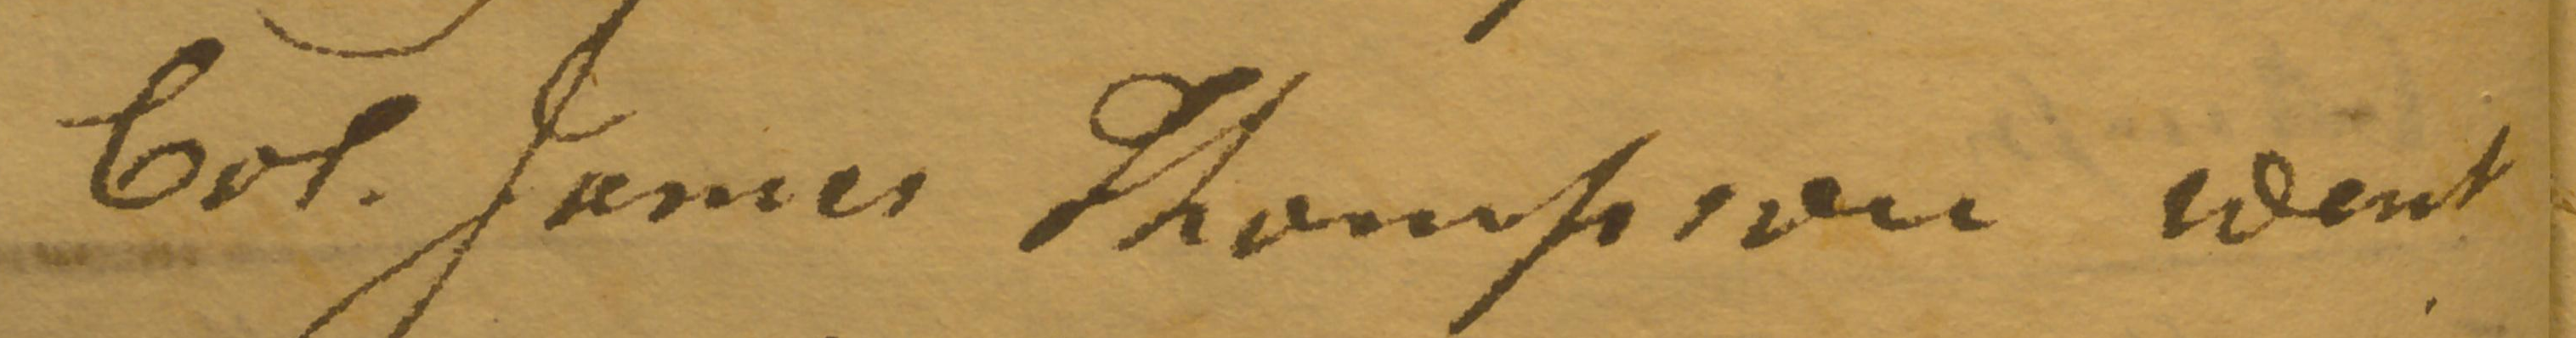Col. James Thompson went
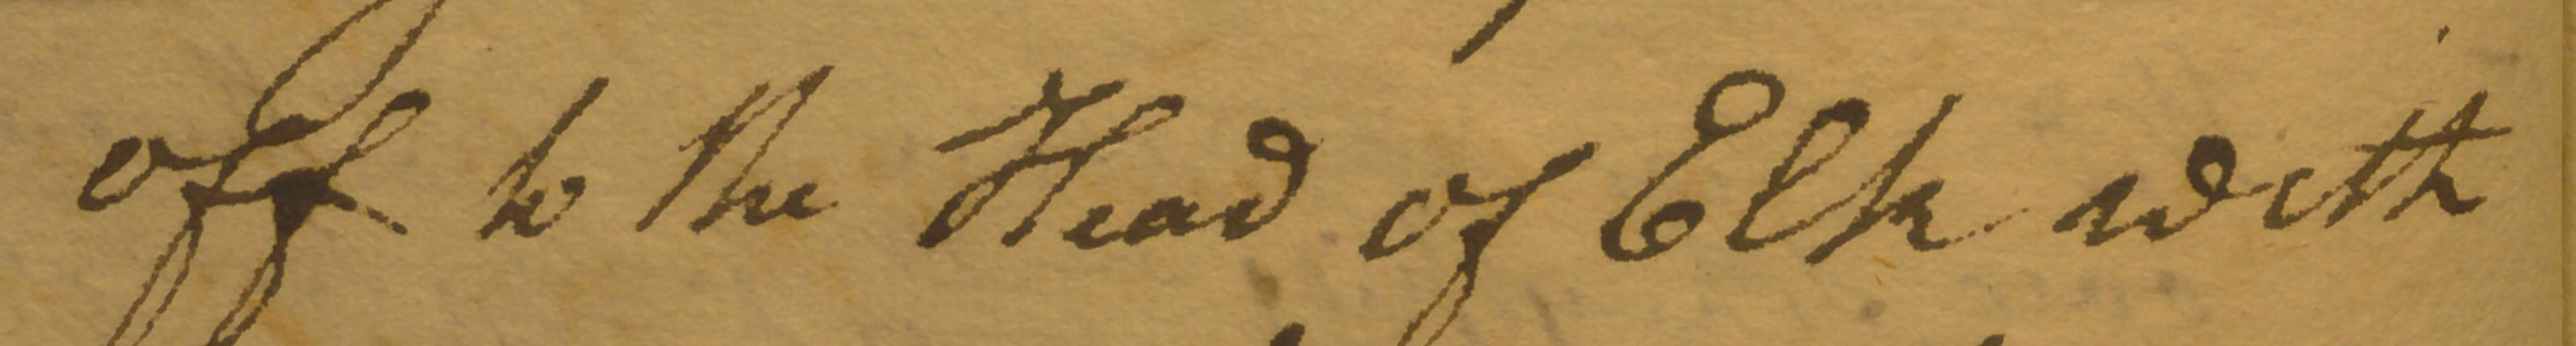off to the Head of Elk with
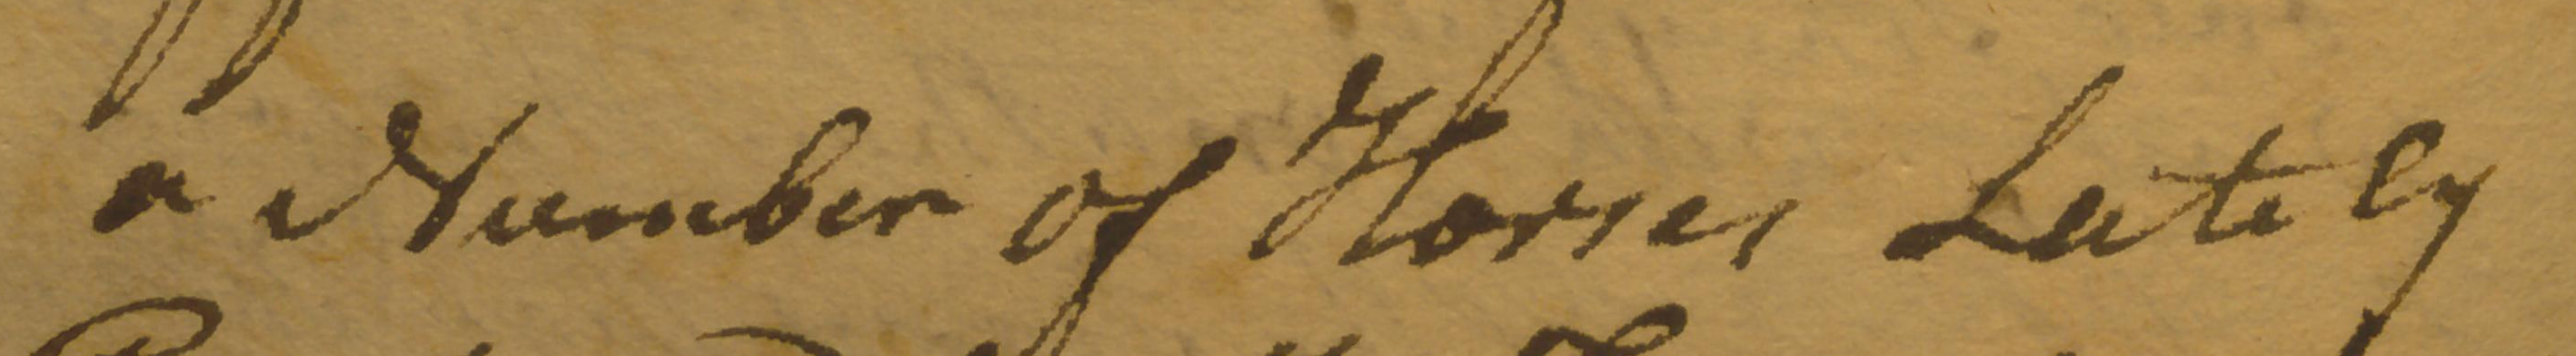a Number of Horses Lately
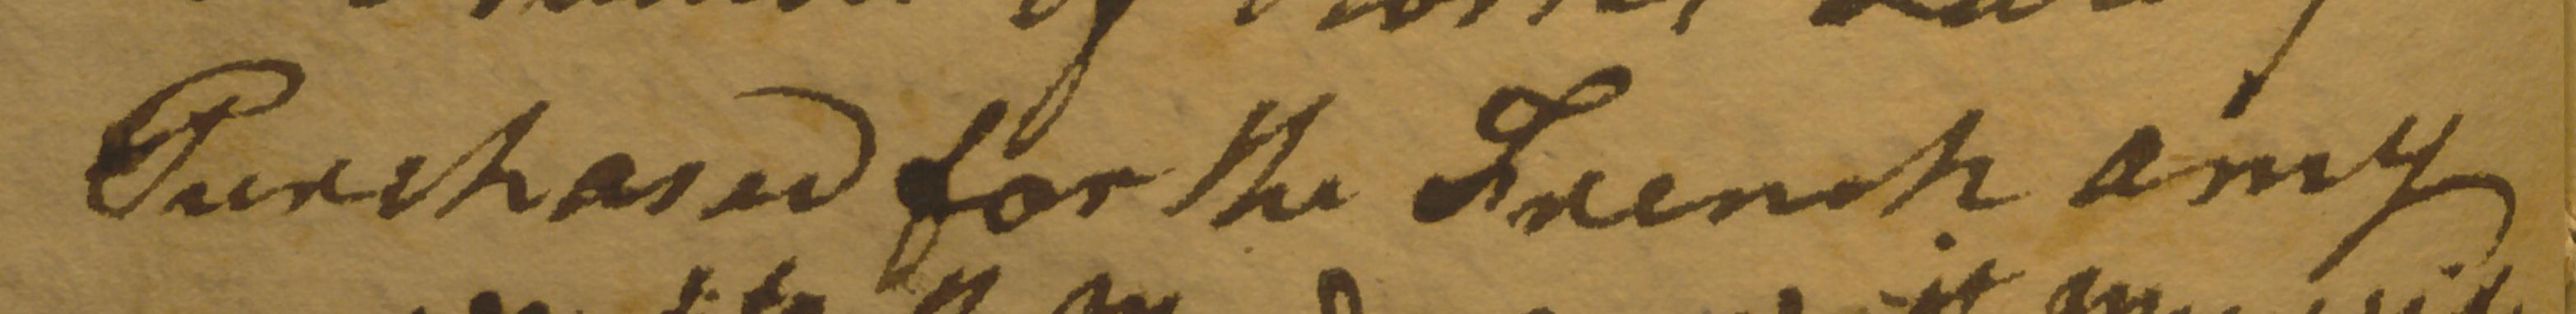Purchased for the French amy
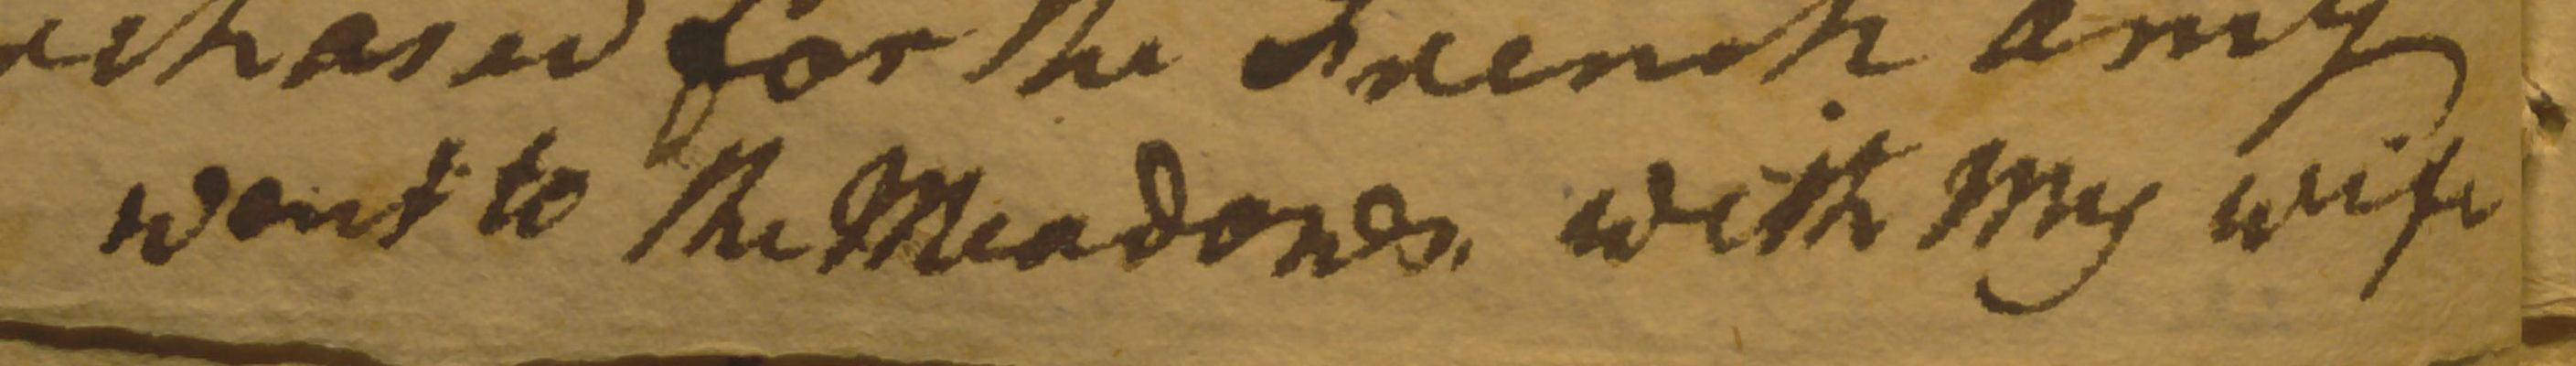went to the Meadows. with My wife
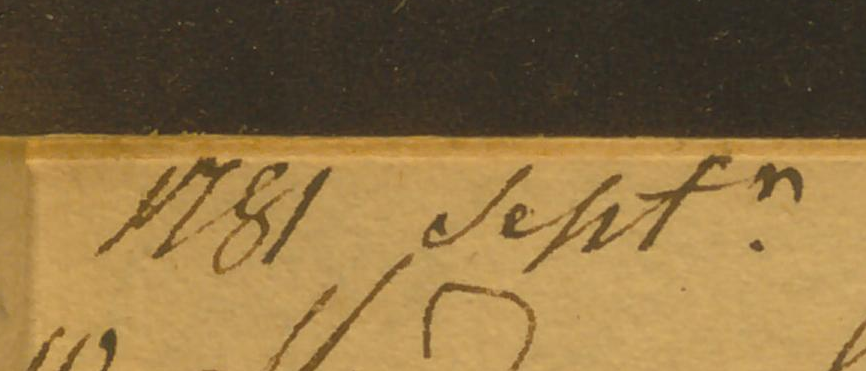1781 Sept^r.
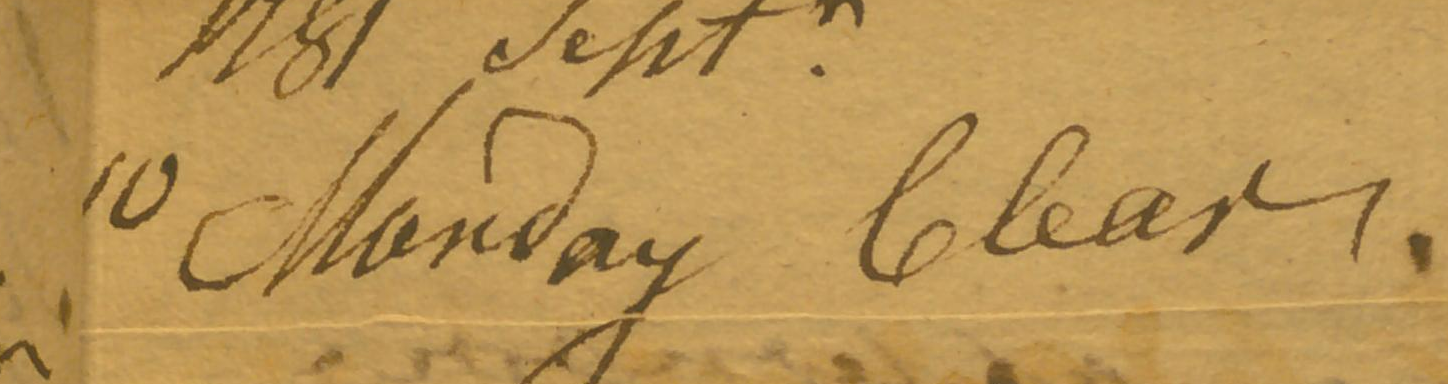10 Monday Clear
